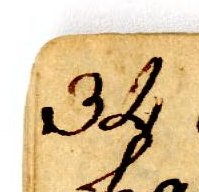34
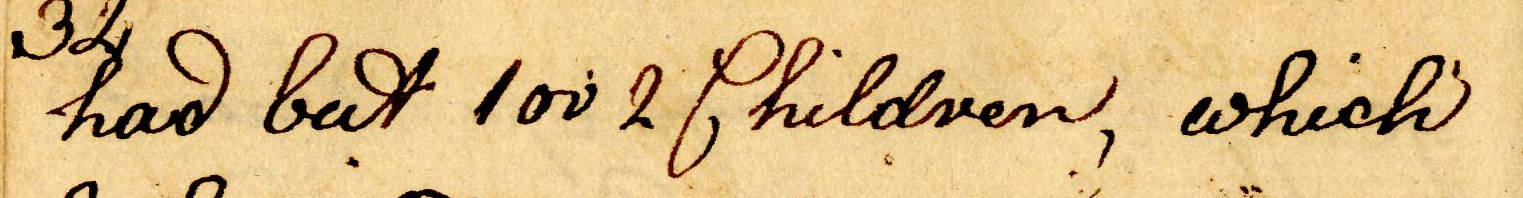had but 1 or 2 Children, which
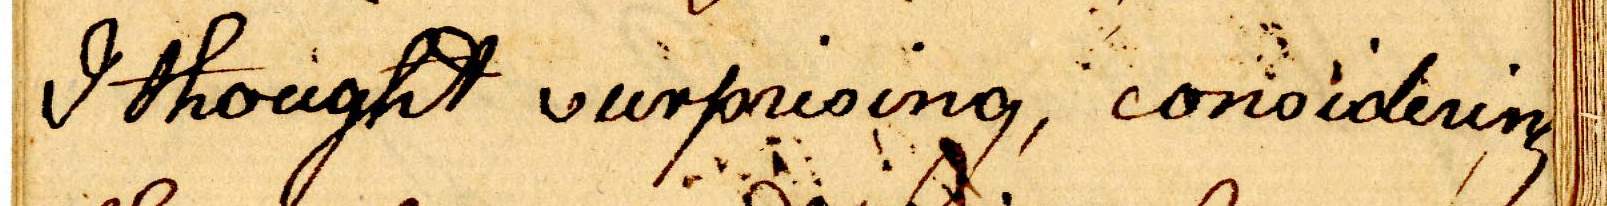I thought surprising, considering
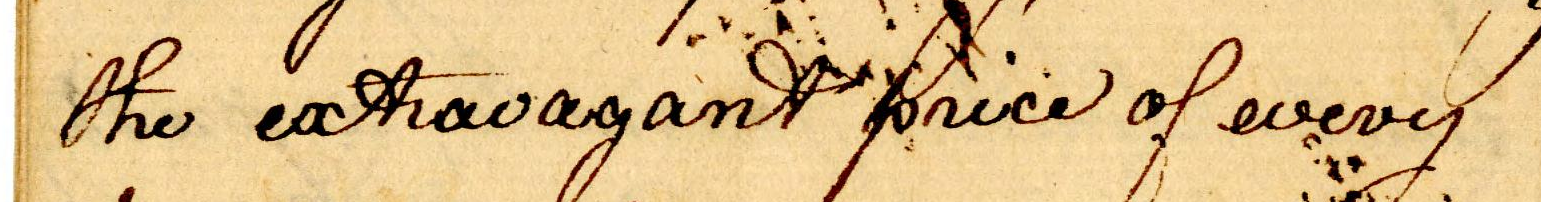the extravagant price of every
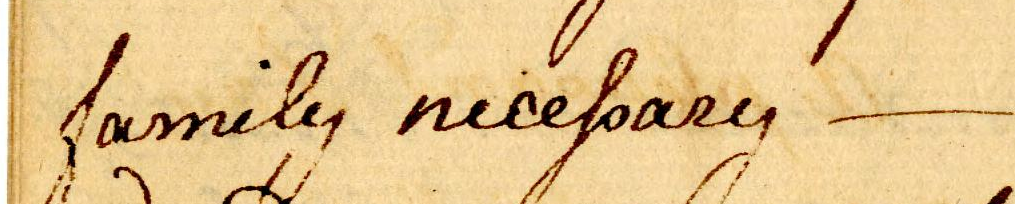family necessary-
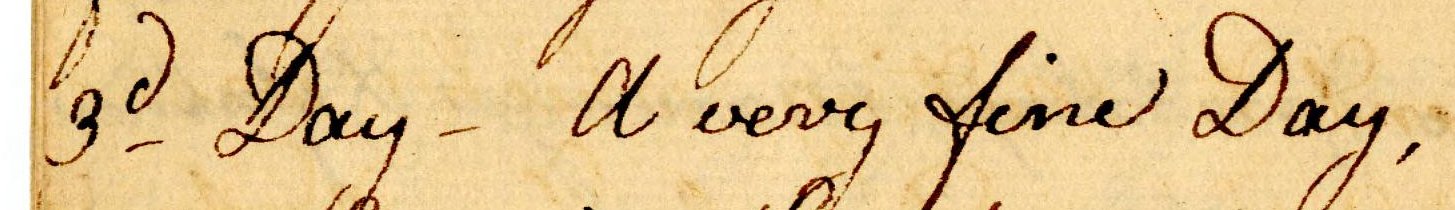3^d Day- A very fine Day,
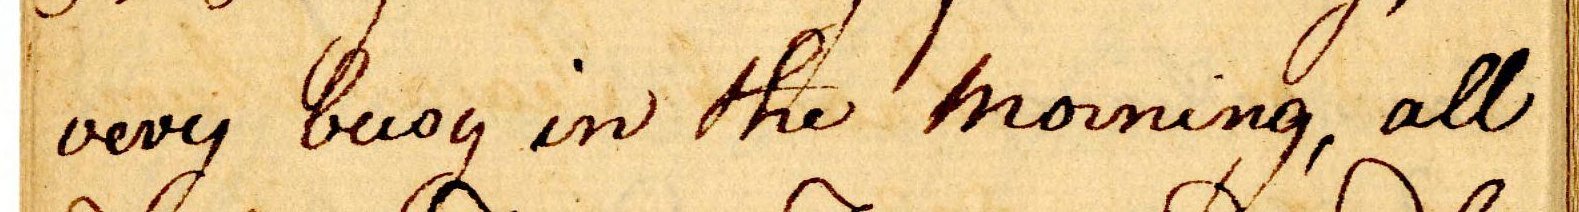very busy in the Morning, all
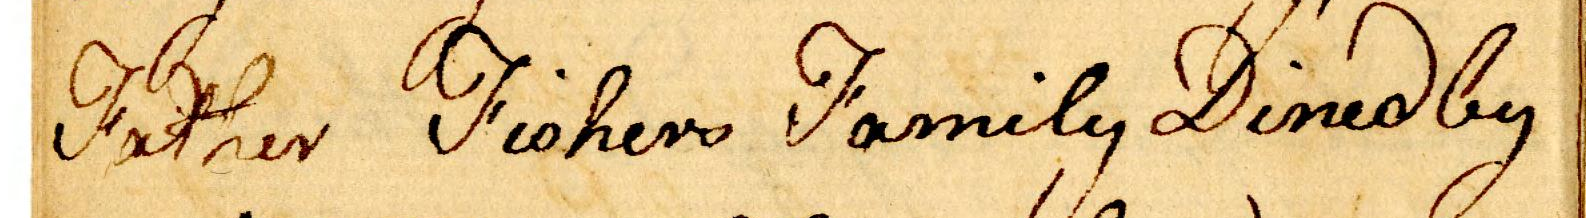Father Fishers Family Dined by
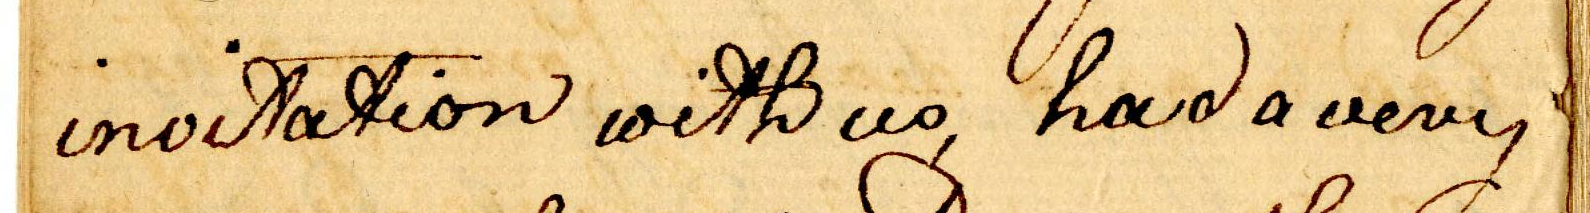invitation with us, had a very
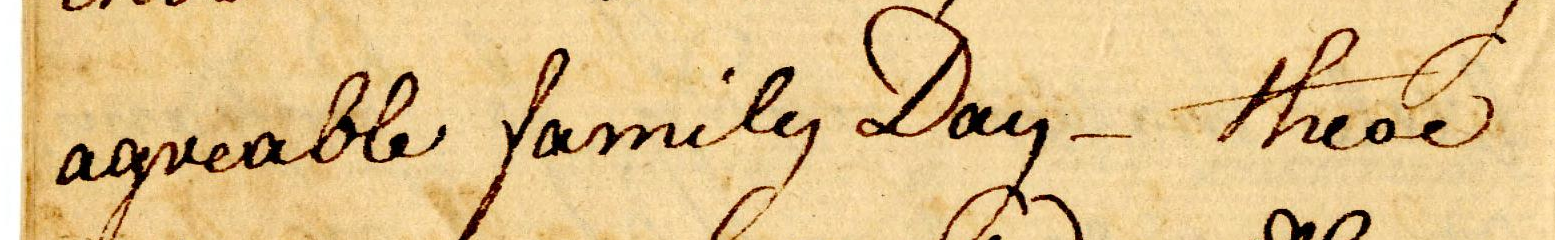agreable family Day- these
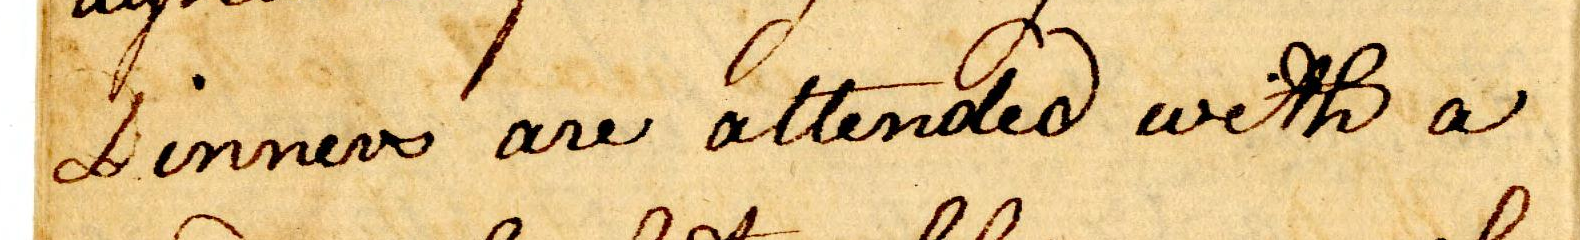Dinners are attended with a
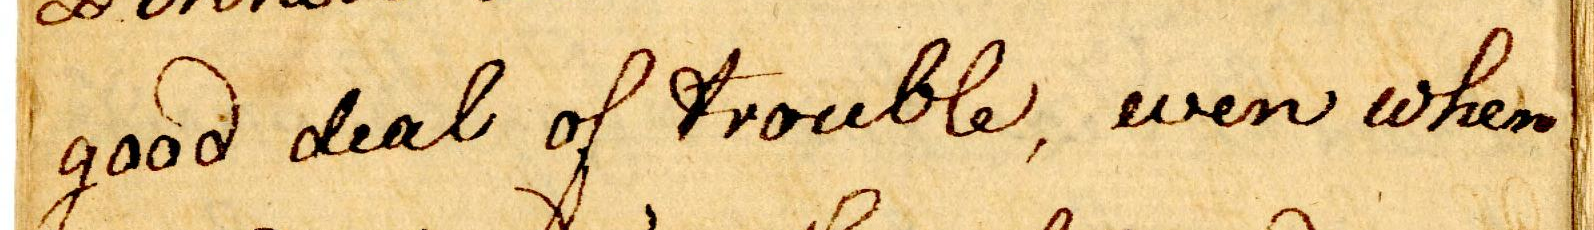good deal of trouble, even when
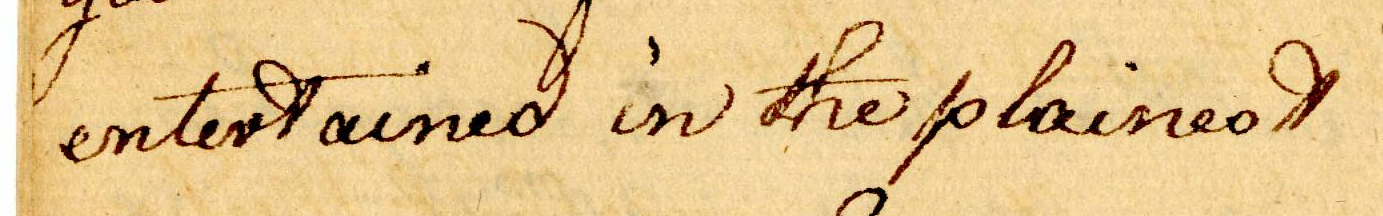entertained in the plainest
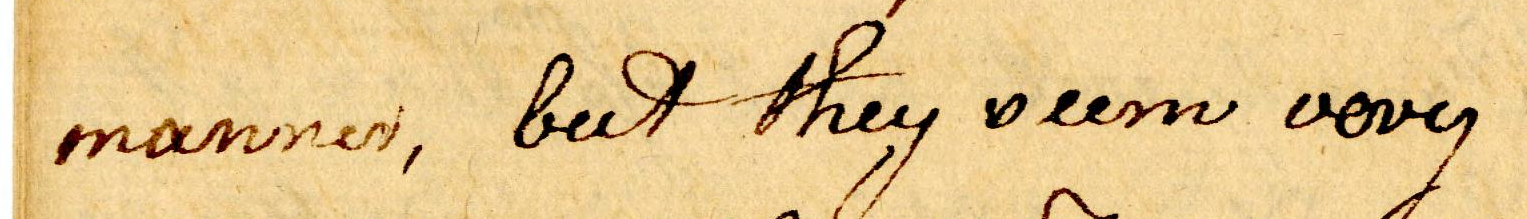manner, bet they seem very
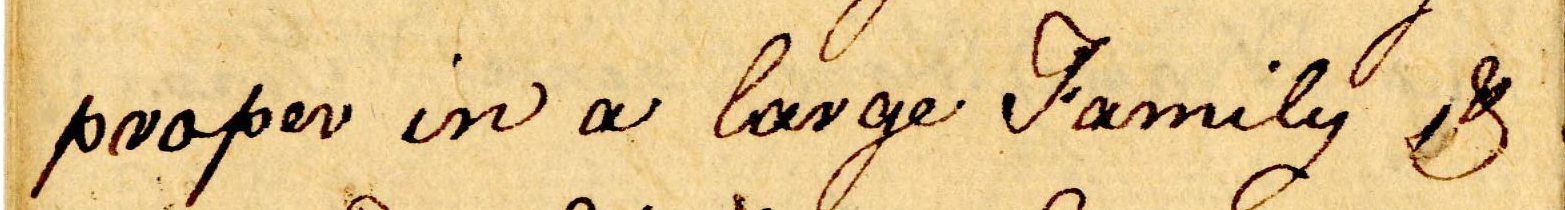proper in a large Family &
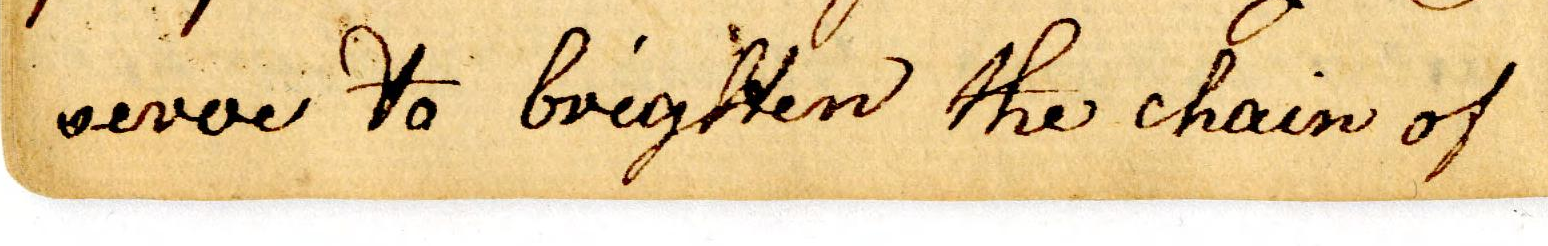serve to brighten the chain of
